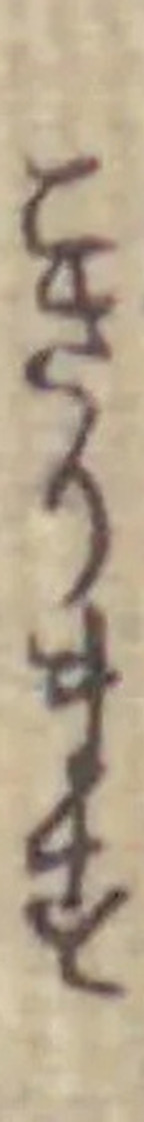こざります
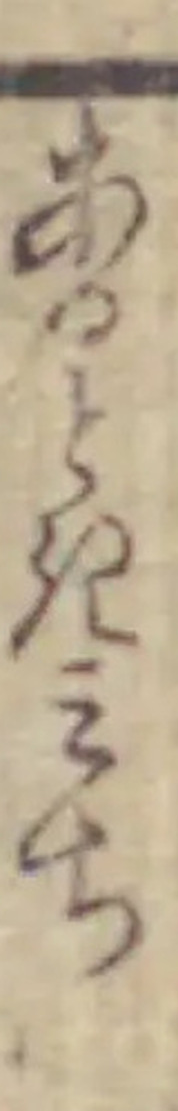あるときみち
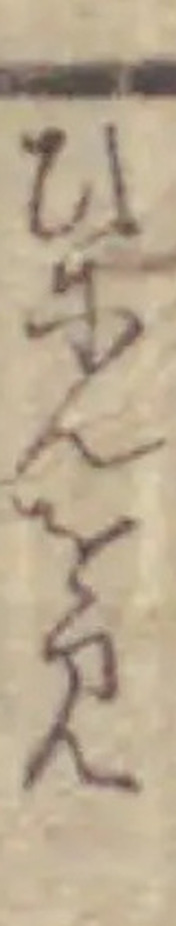ひにんを見
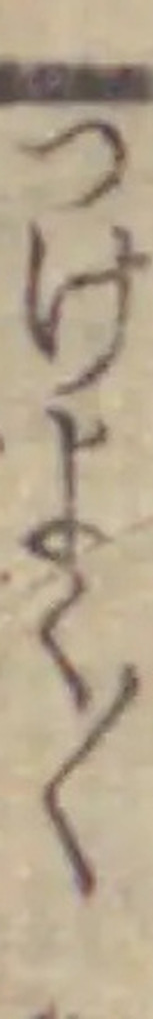つけよく〳〵
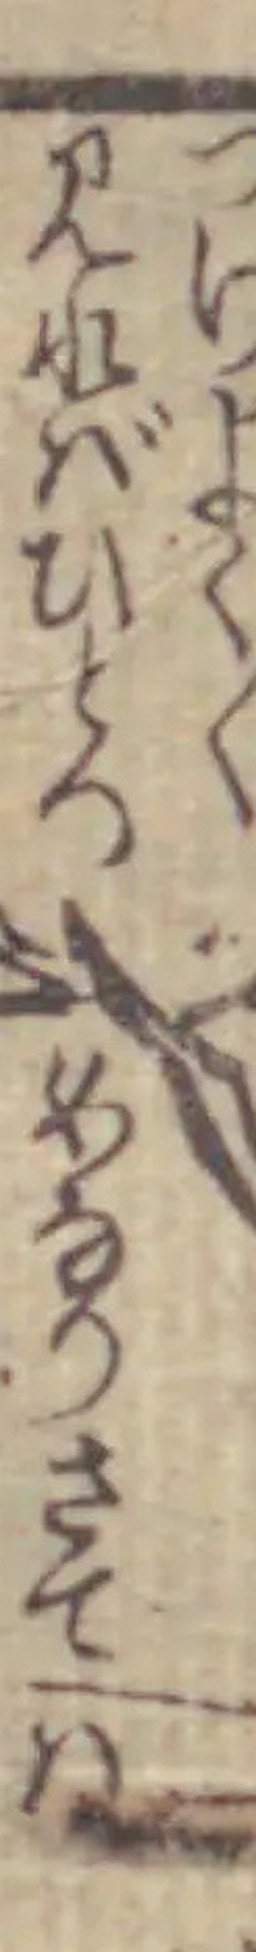見ればひとつめなりさては
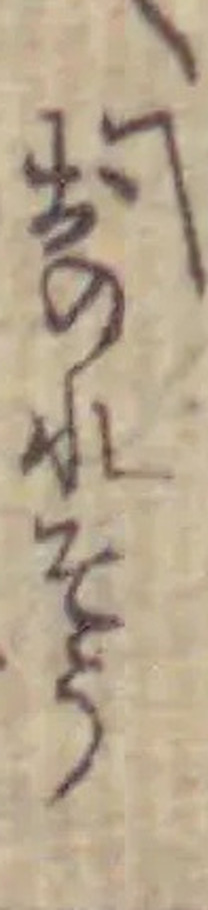〽おのれそう
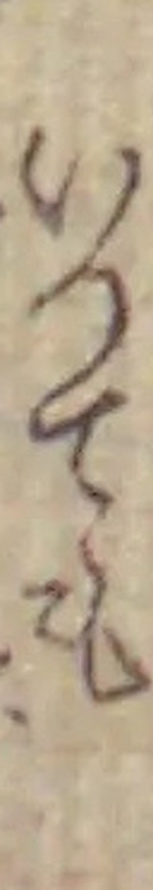いつても
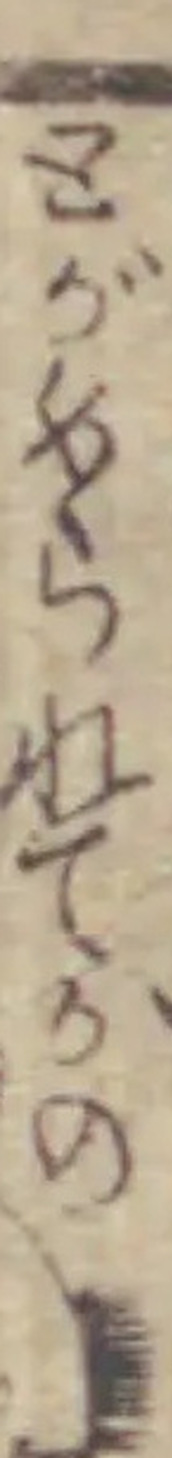とがめられてかの
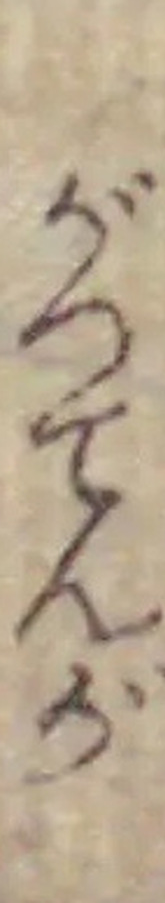がつてんが
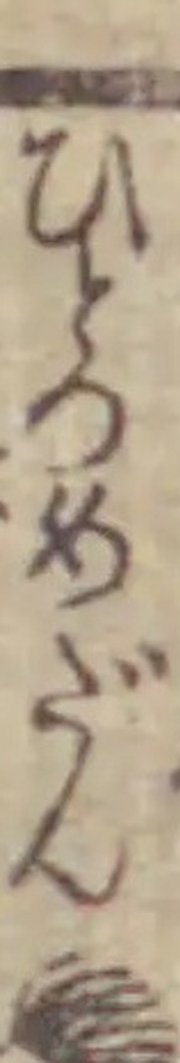ひとつめだん
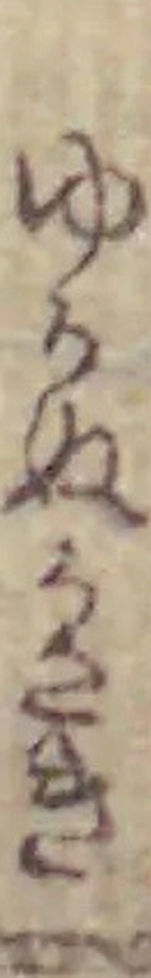ゆかぬかたき
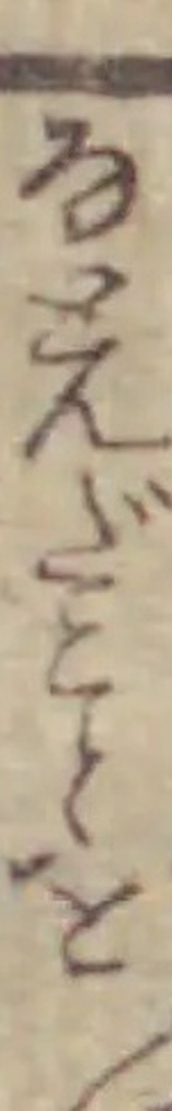なとんだことを
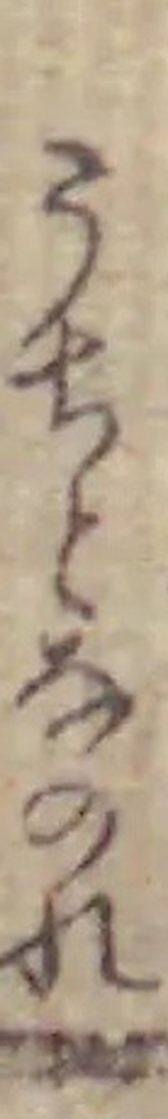うちとなのれ
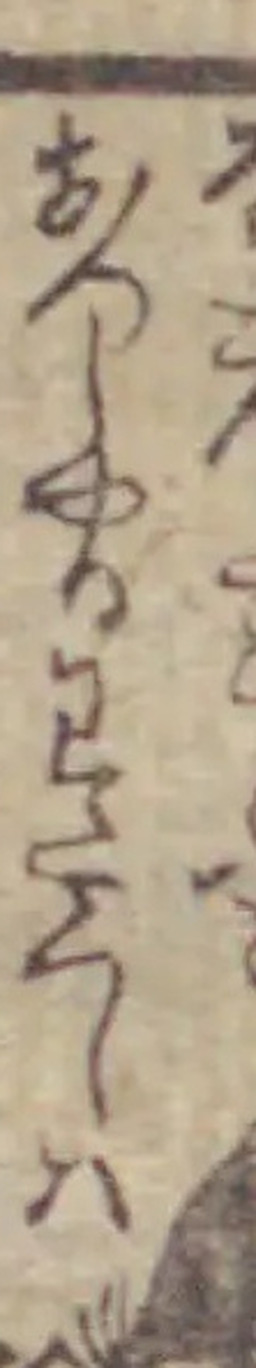おつしやるわたくしは
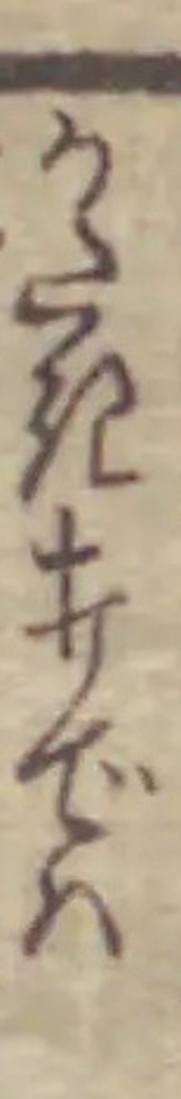かたき打では
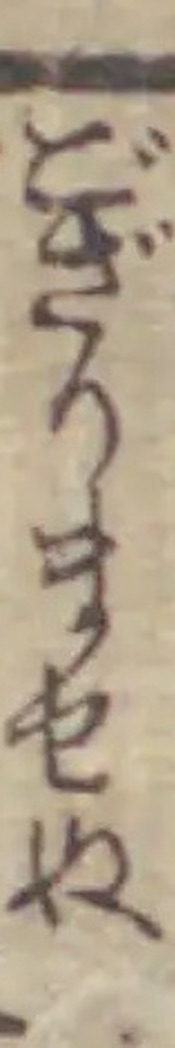ござりませぬ
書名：化物敵討 2巻
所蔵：国立国会図書館 National Diet Library, JAPAN
